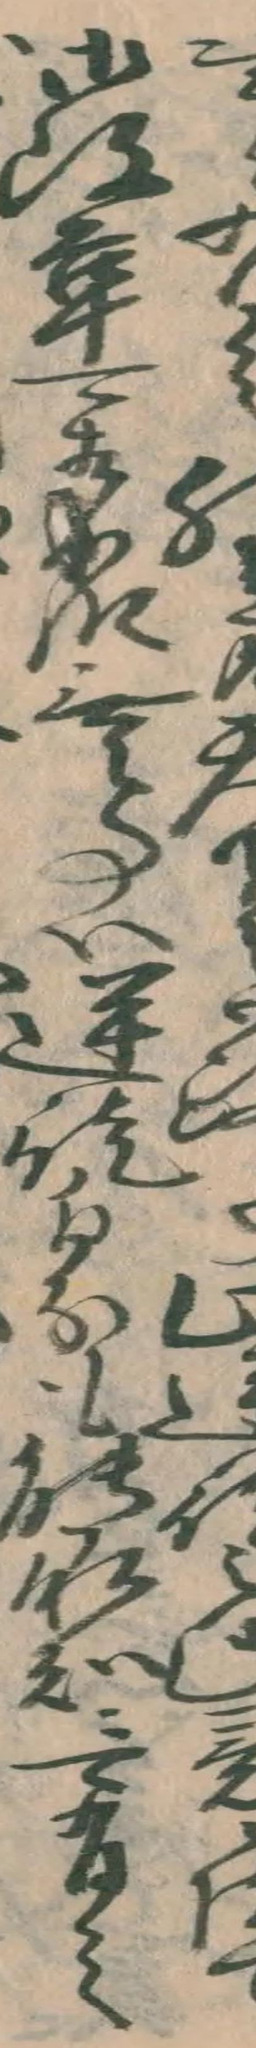御改革可相成様無之事ハ逆徒自分も能承知ニ可有之
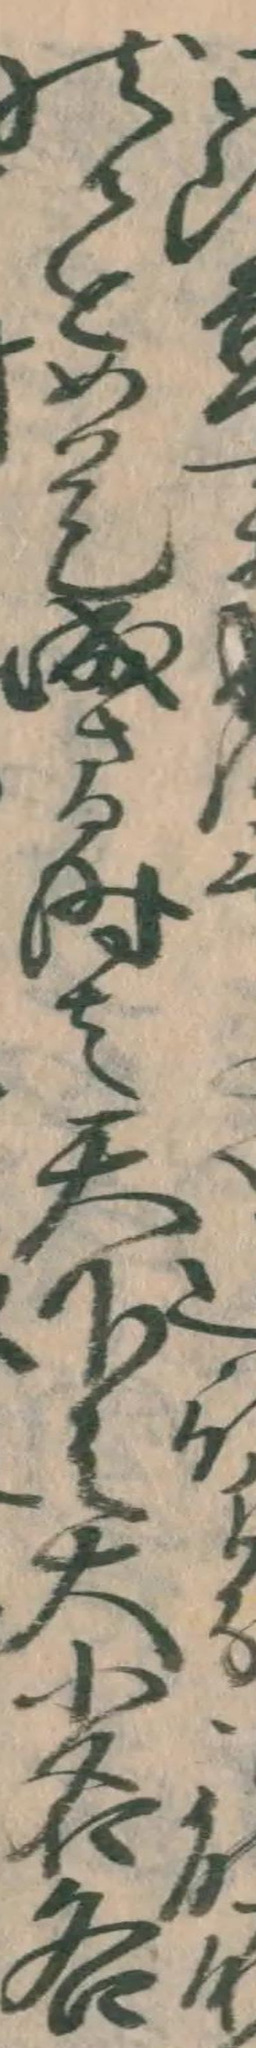然ルを如是成さる時者天下之大小名各
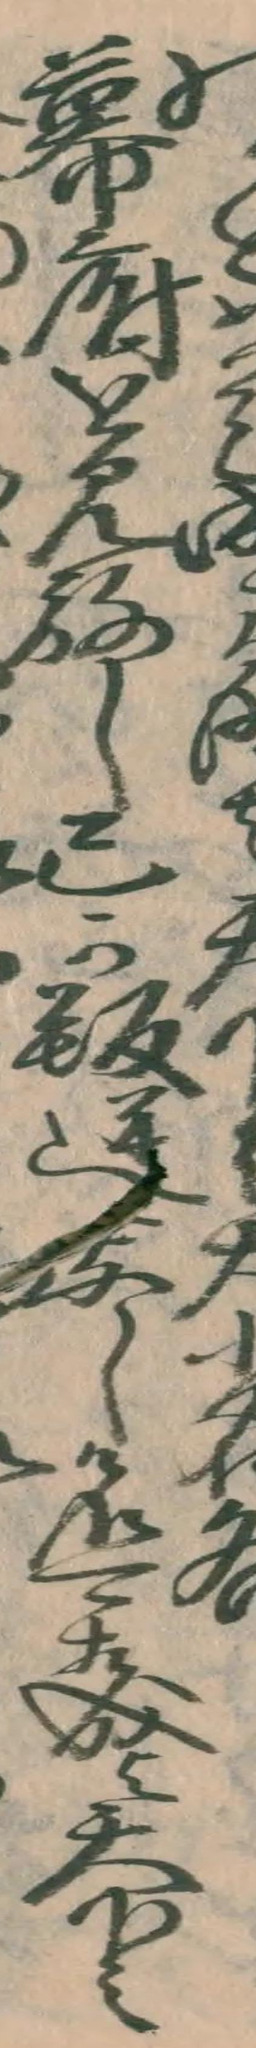幕府を見放し己か叛逆ニ与し候様可相成と天下之
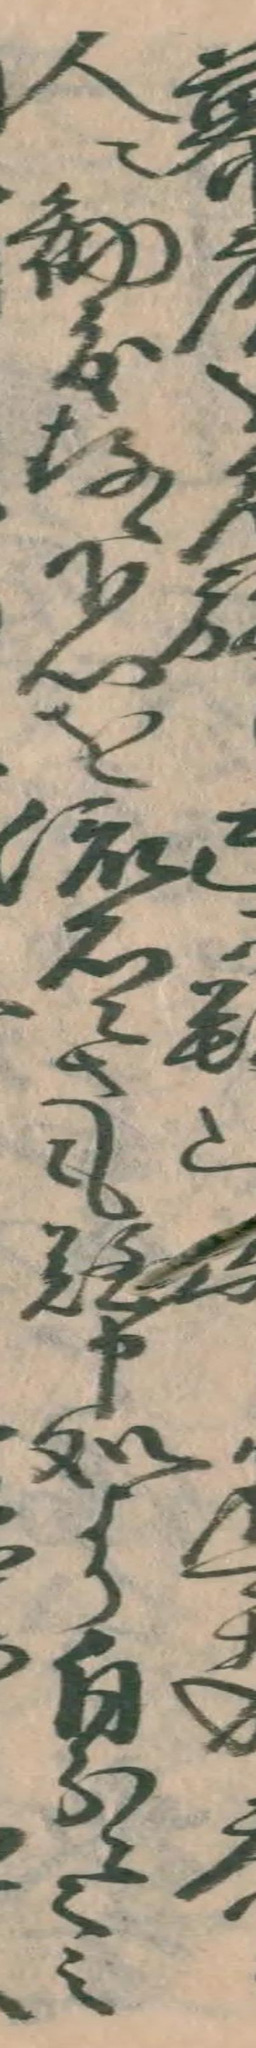人ニ勧度存候下心を流石ニさも難申処より自分々々之
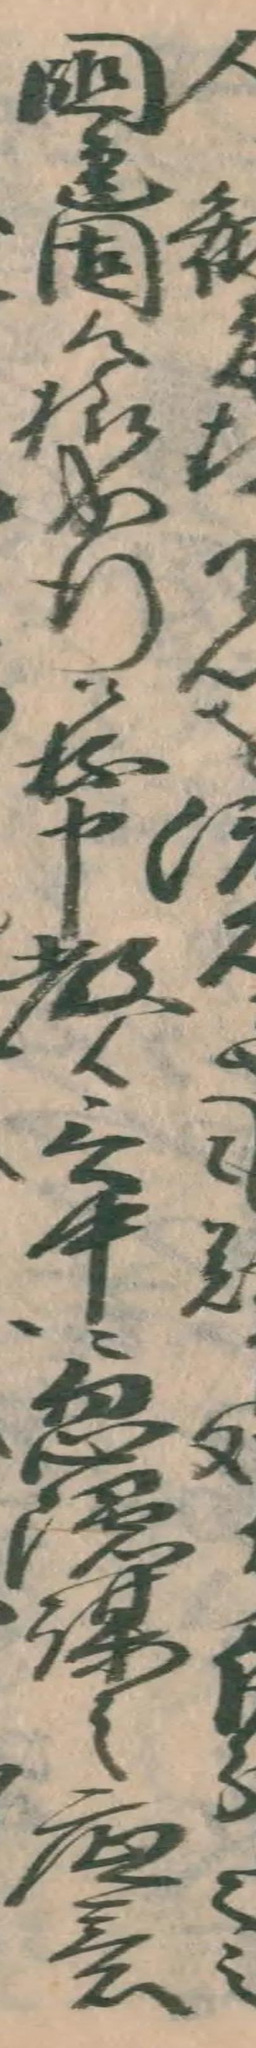国而已固候様成行候抔申教候言中ニ忽隠謀之底意
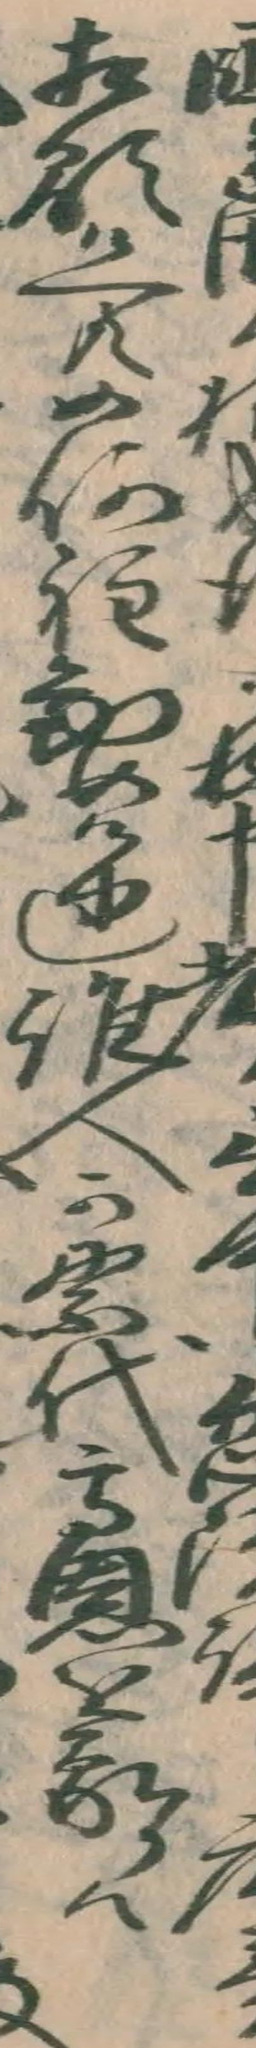相顕候へ共如何程勧め候迚誰人か累代高恩を蒙り候
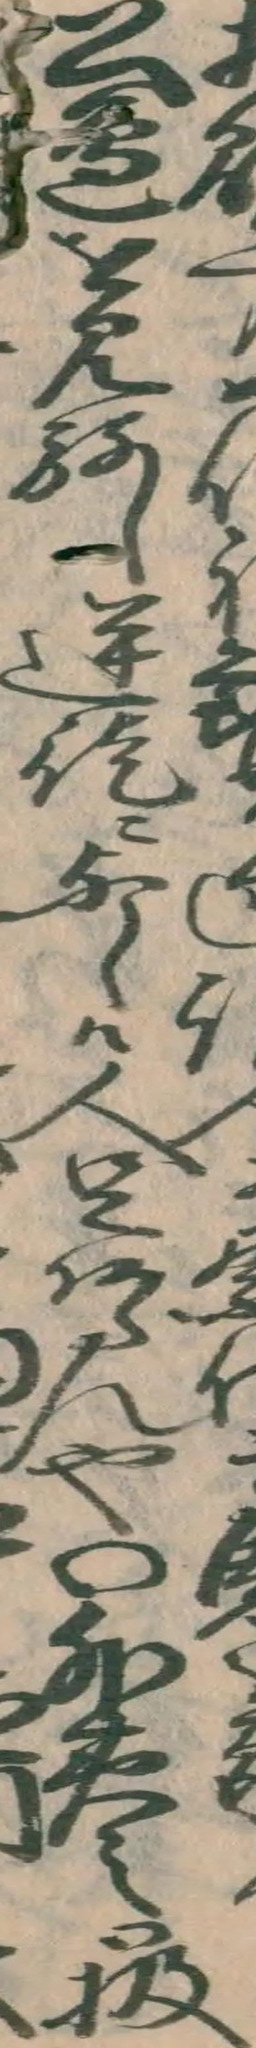公邊を見放し逆徒ニ与し候人是あらんや○外夷之御扱
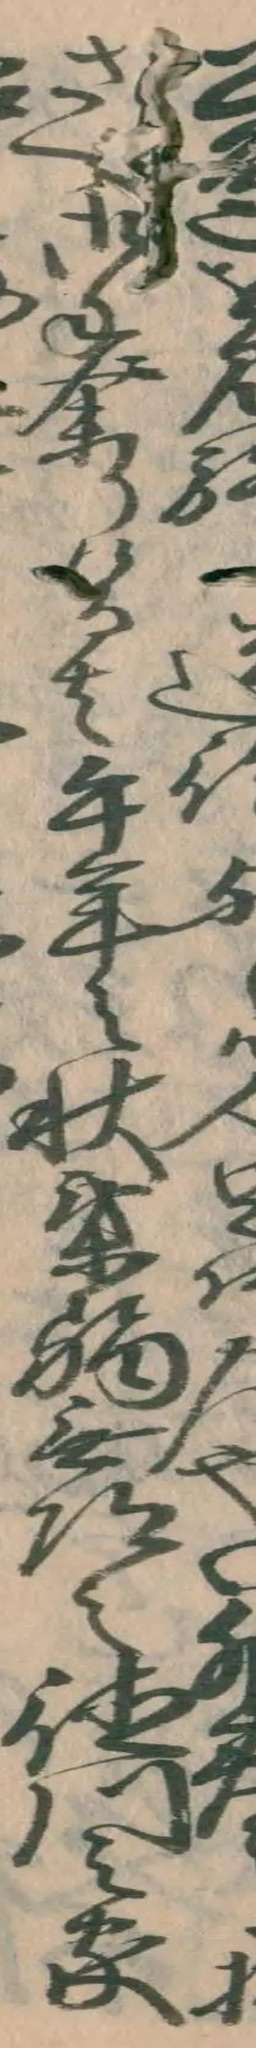さへ御手ニ余りける者午年之秋柔弱無道之徳川之家
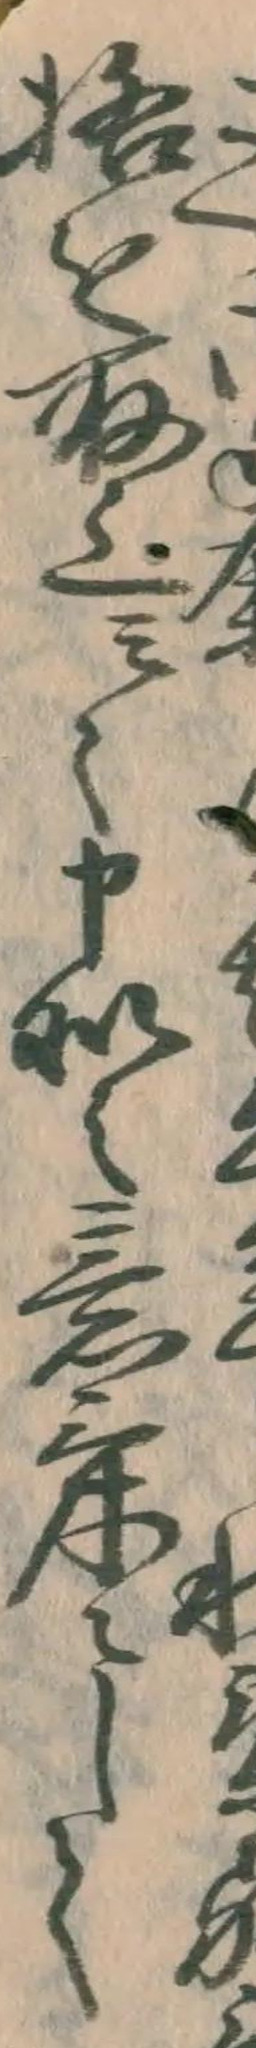格を取上云々申処之意氣ニして
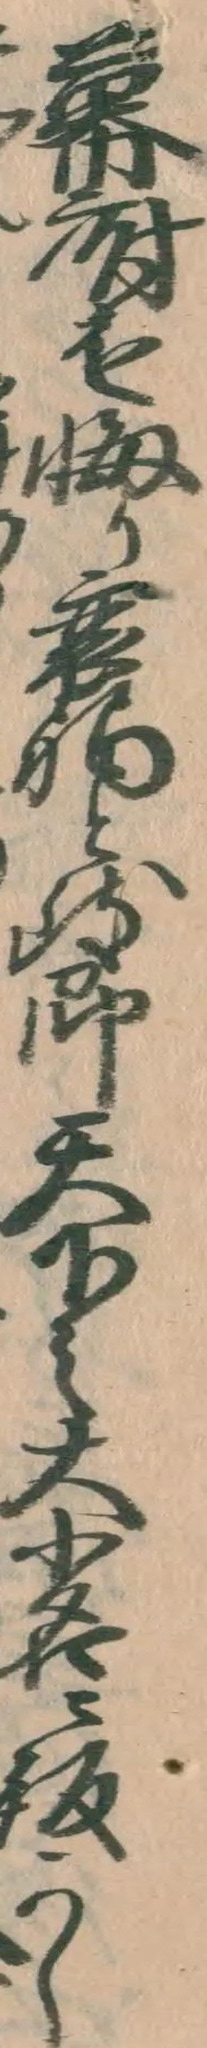幕府を侮り衰弱と致即天下之大小名ニ叛かし
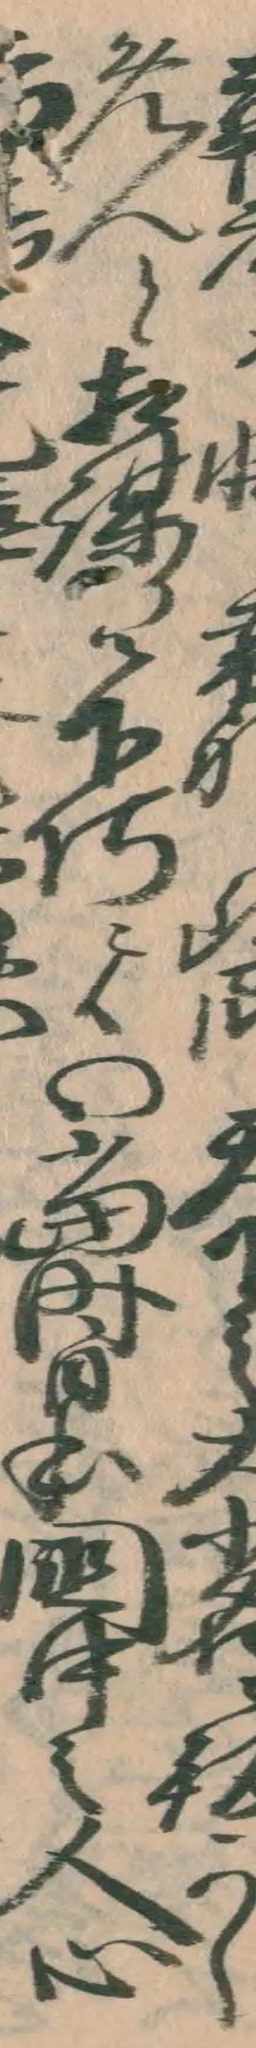めんと相謀り候下巧ニ候○當時日本国中之人心
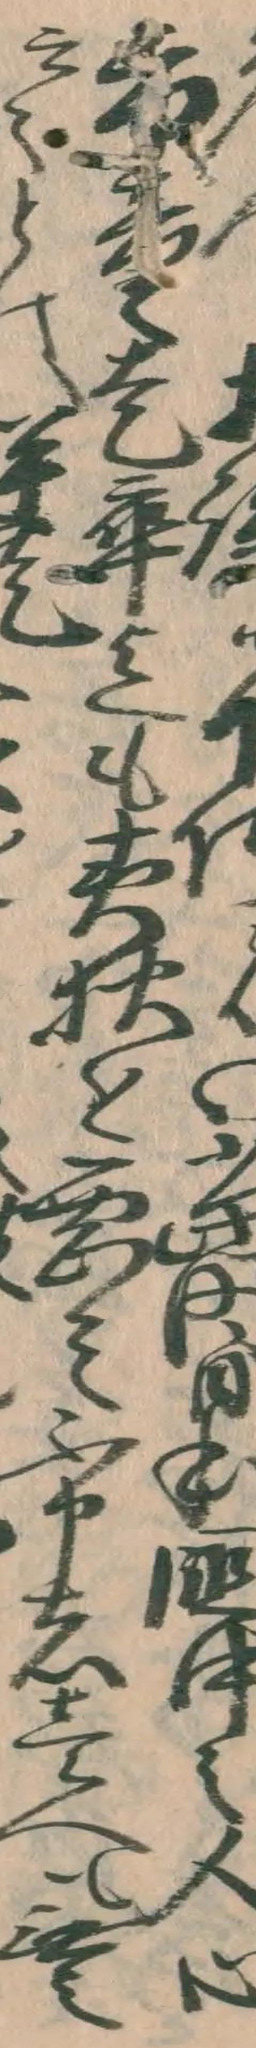市童老卒迄も夷狄を悪ミ不申者壱人も無之
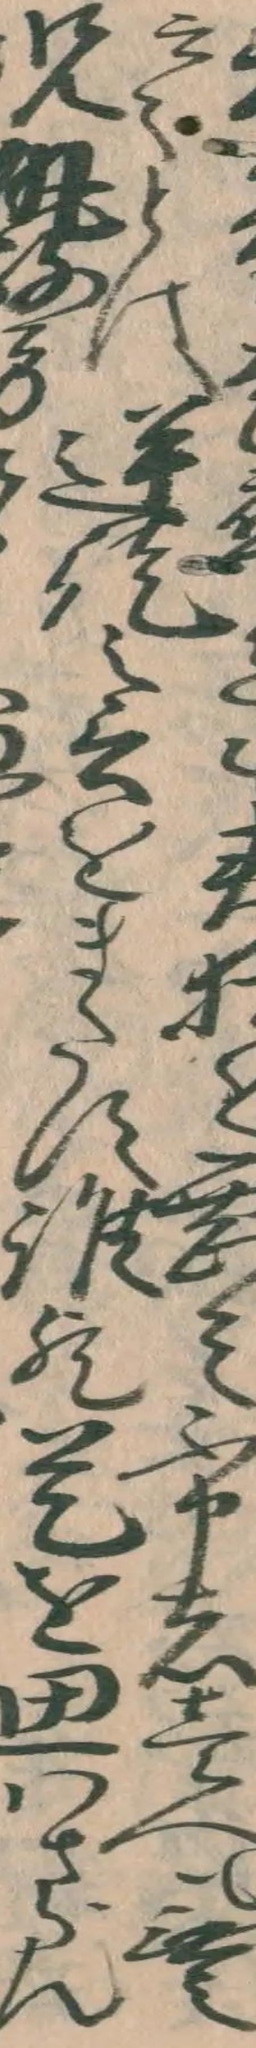云々とは逆徒之言をまたす誰欤是を思ハさらん
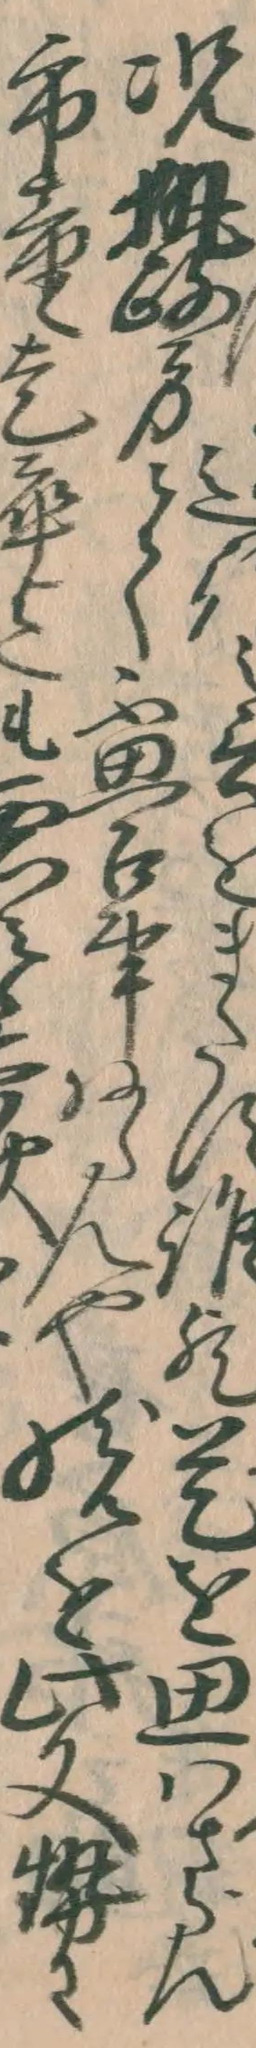况執政方ニて不思召事あらんや然ルを此又勢に
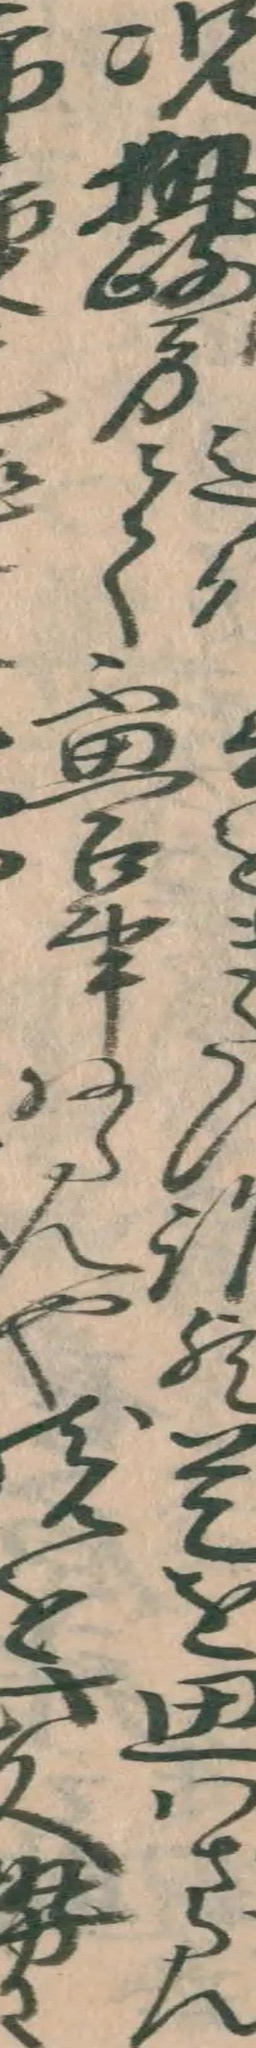况執政方ニて不思召事あらんや然ルを此又勢に
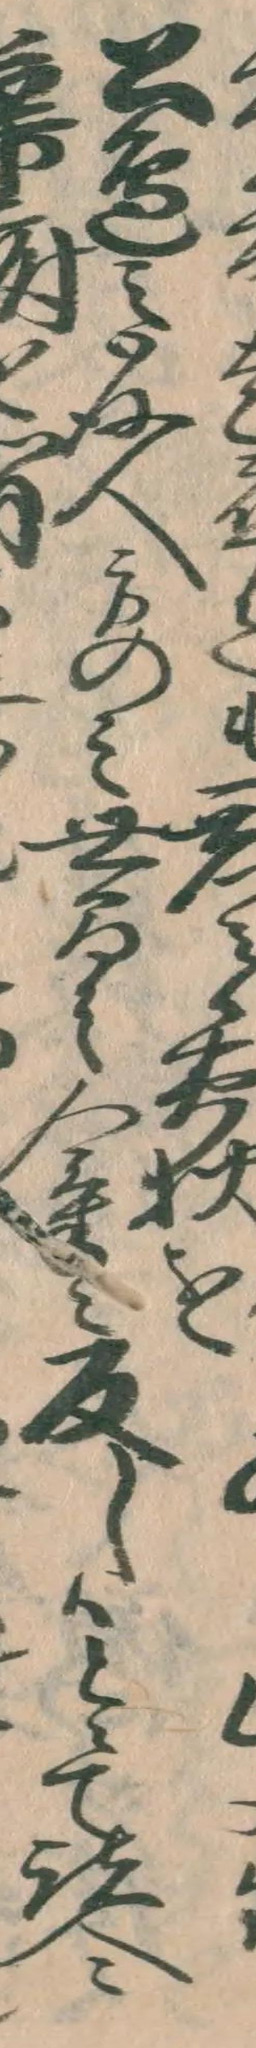公邊之御役人方のミ世間之人氣ニ反し候と候て諸人ニ
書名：麗斎叢書. 20
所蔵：国立国会図書館 National Diet Library, JAPAN
